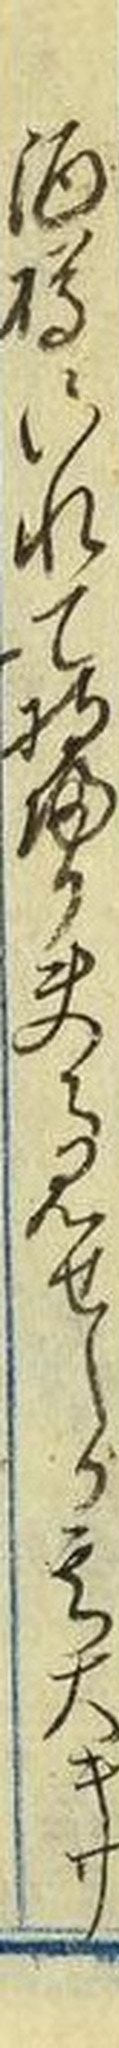酒樽にいれて持帰り夫々見せしが其大きさ
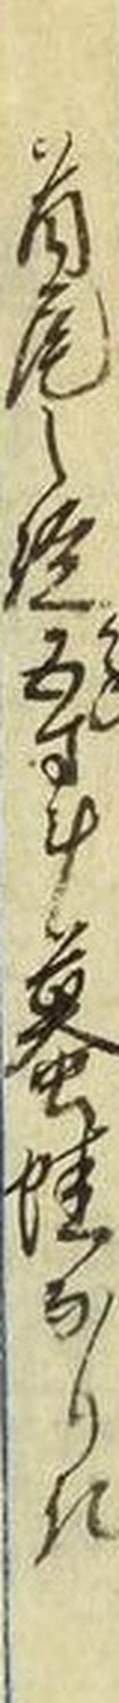首尾之径手五寸計蟇蛙なりき
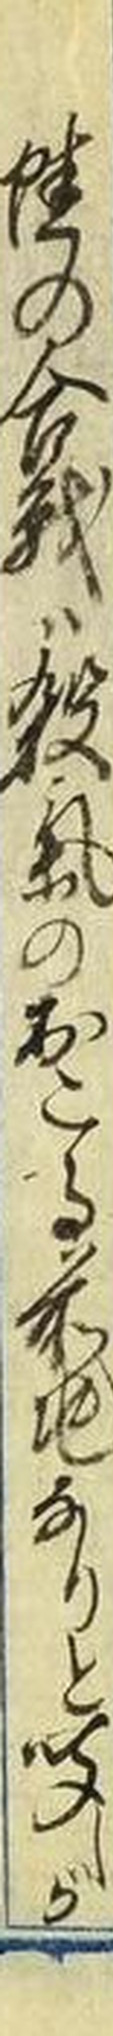蛙の合戦は殺風のおこる前兆なりと聞しが
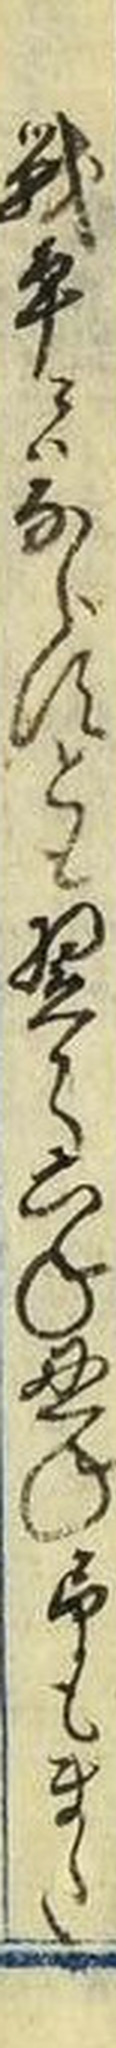戦争にはならすとも翌々六年丑年即もまた
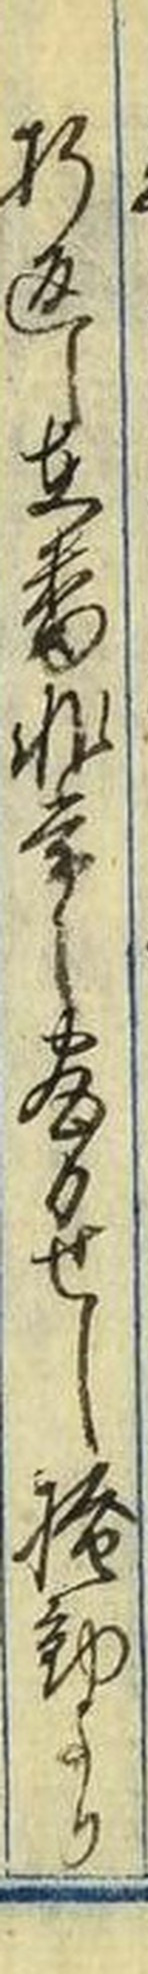折返し在番非常之尽力せし騒動より
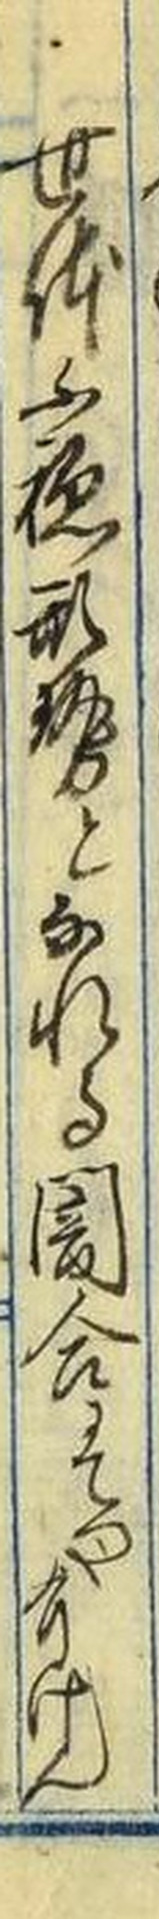世体不穏形勢となれる闇合にてや有けん

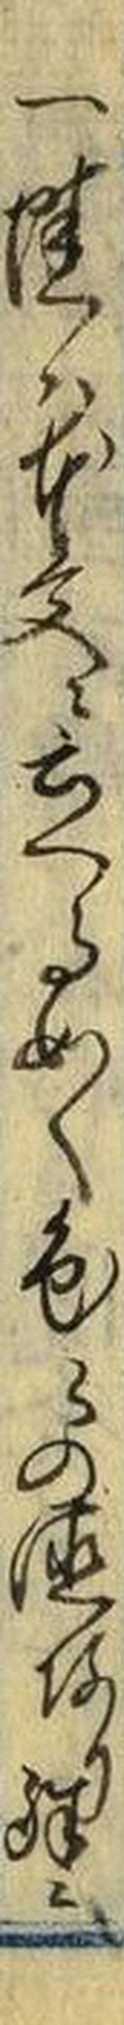一蛙は本文に言へる如く色々の徳あり殊に
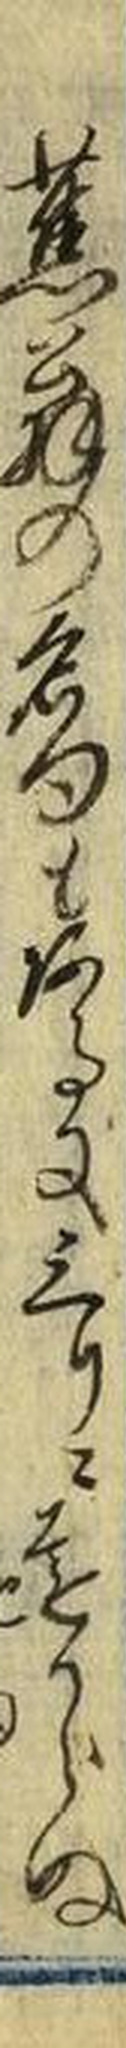蕉翁の名句もあるに三りに遠からぬ
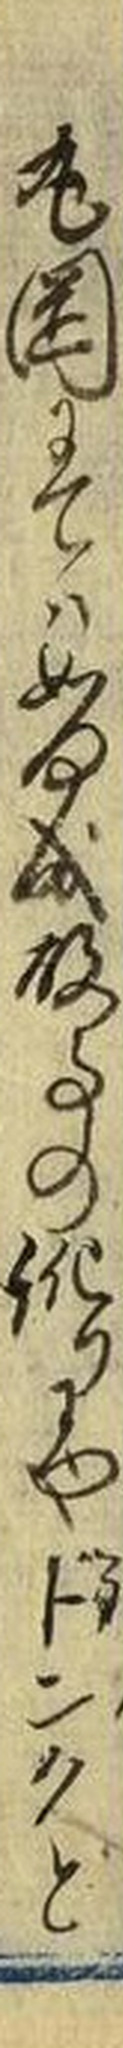丸岡にては如何成故事の訛にやドンクと
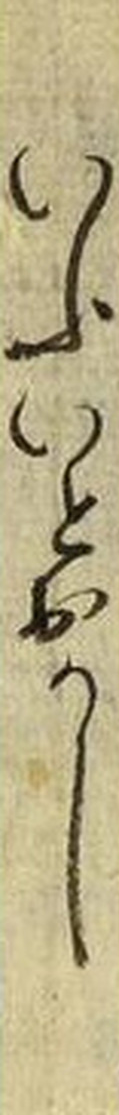いふいとおかし
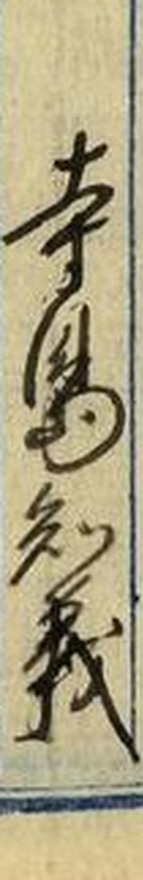寺島知義
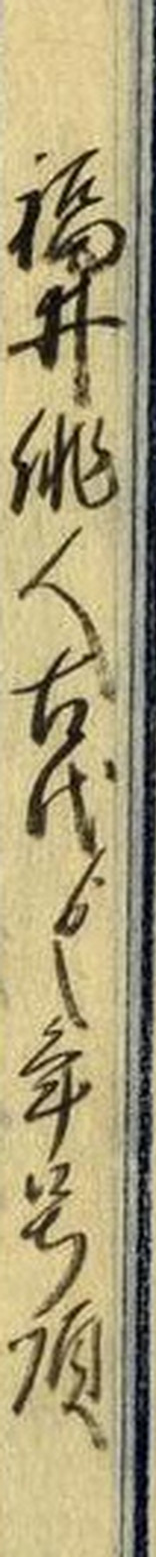福井俳人古代ゟ之年号順
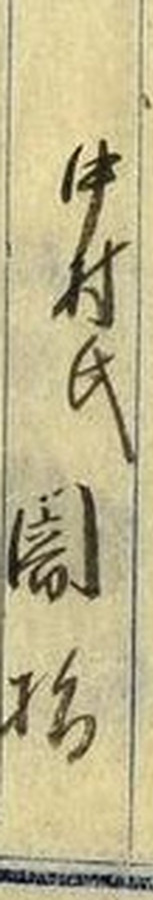中村氏闇指
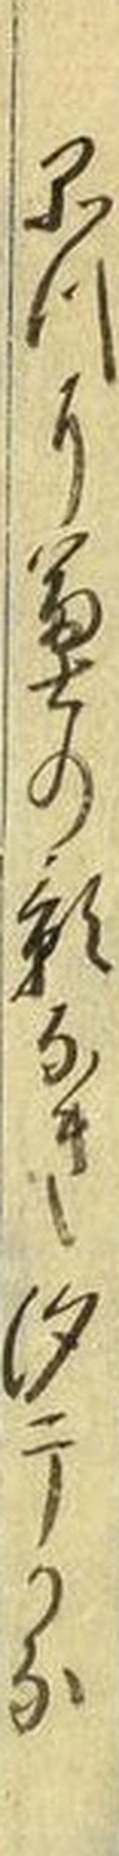品川に冨士の影なき潮干かな
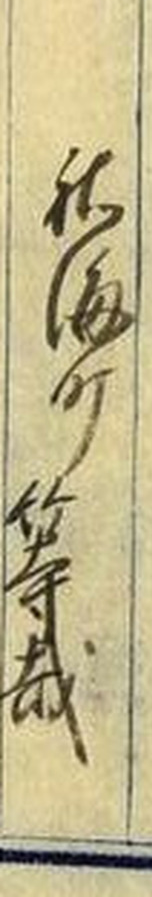祐海町等哉
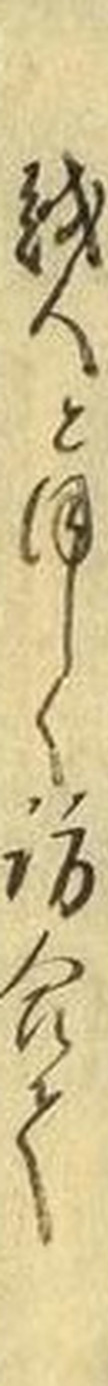越人と同しく訪合て
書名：温古集 三巻
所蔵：福井県文書館 Fukui Prefectural Archives
